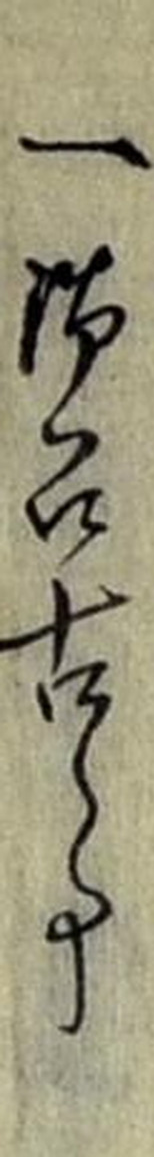一御召古之事
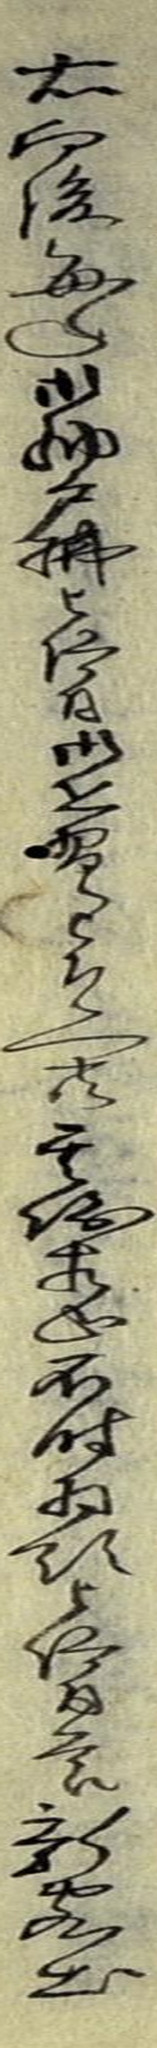右向後毎年御納戸払被仰付御近習へ被下候へ共其儀相止不時拝領被仰付節新敷出
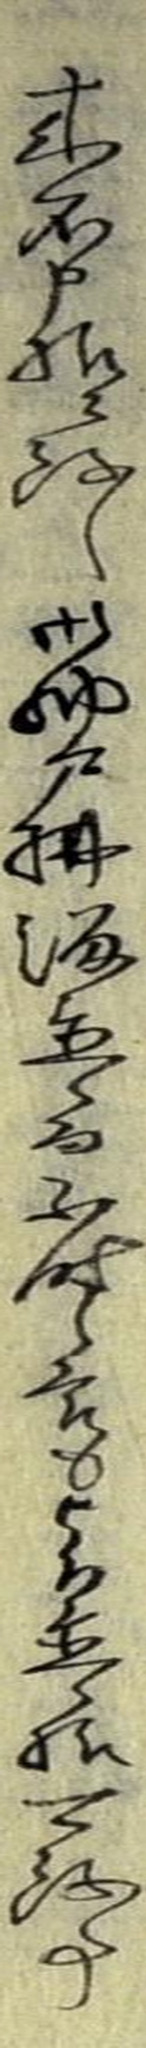来不申様ニ致し御納戸払溜置候而不時之節も被下置候様可致事
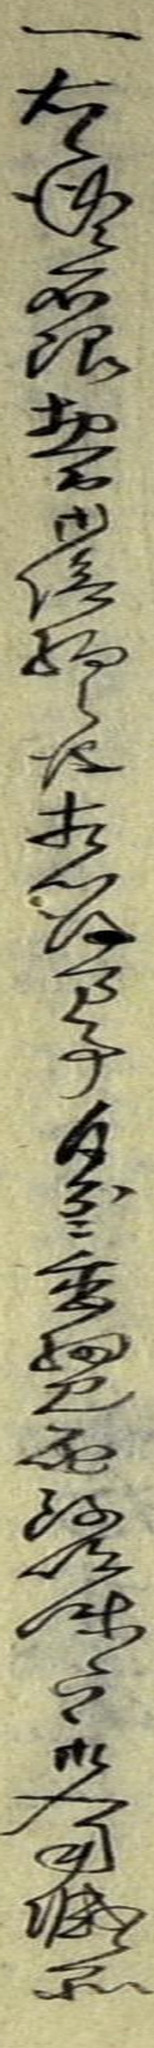一右之趣ニ不限惣而御倹約之儀相心得万事自分ニ委細見届致吟味候ハヽ御入用減候品
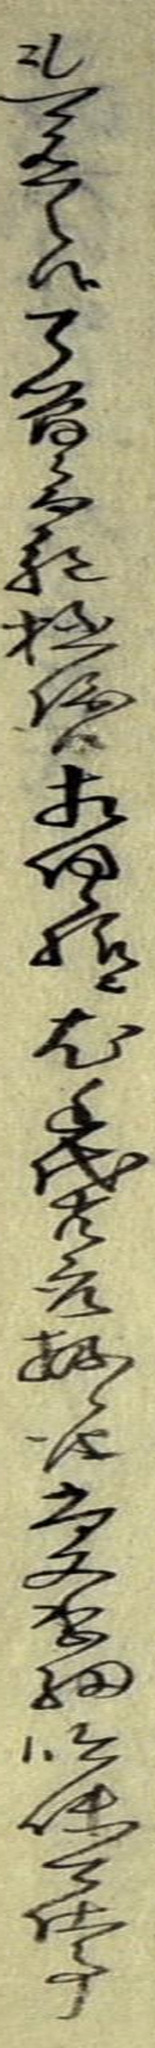も可有之候了簡ニ而程極儀ハ相伺候様ニ尤手代共取扱候儀尚又委細吟味可仕事

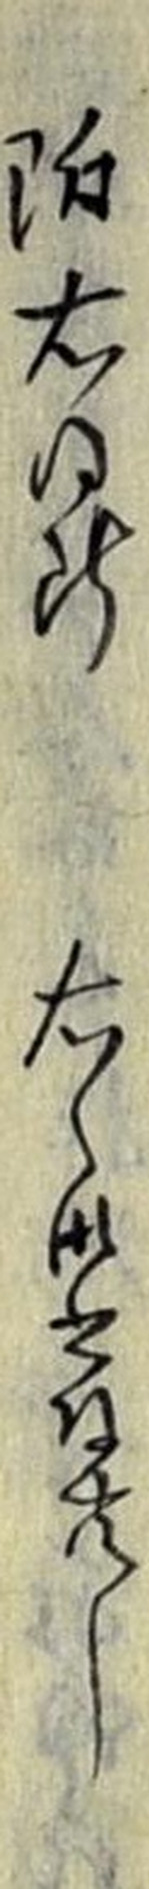附右同断右之御書付共之
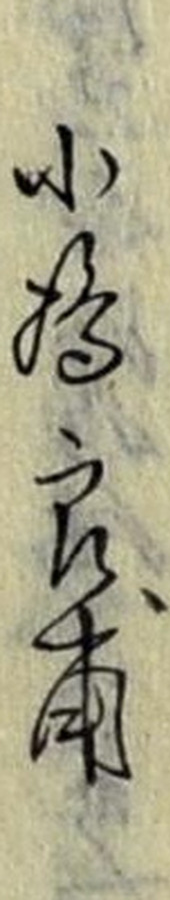小嶋良甫
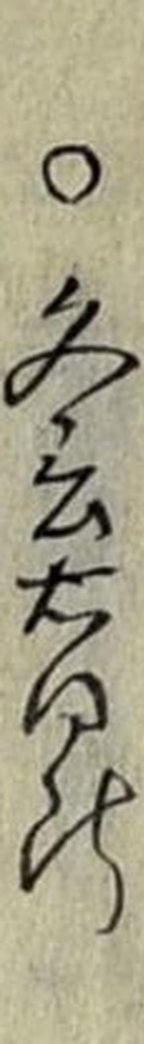〇文言右同断
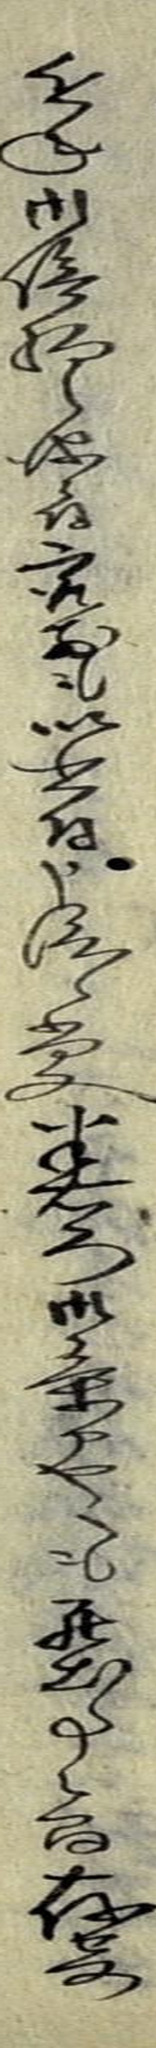近年御倹約之儀ニ付最前も以書付申渡候尚又半右衛門御茶部屋へも罷出事候間存寄
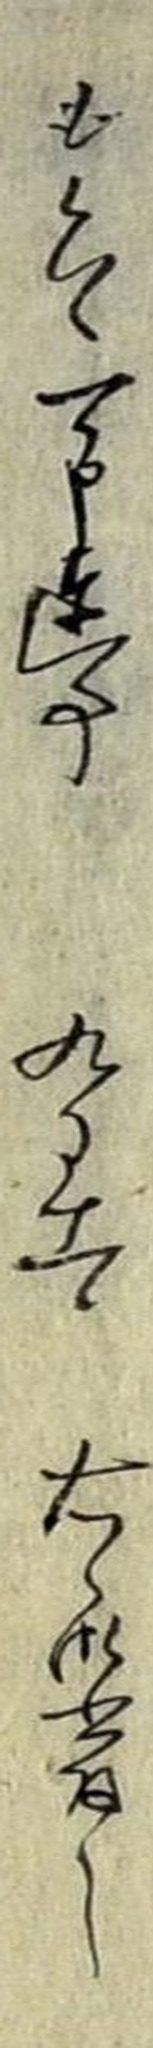も候ハヽ可申達事九月十一日右之御書付之
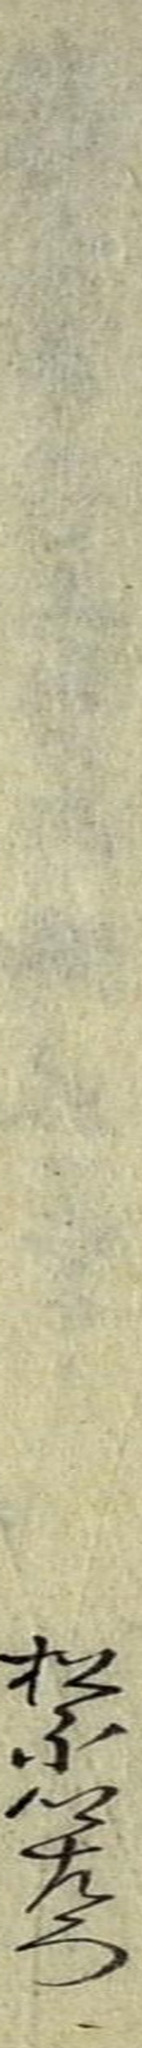松永郷左衛門
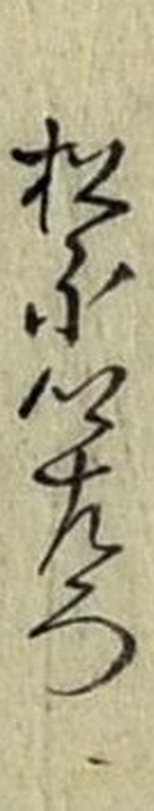松永郷左衛門
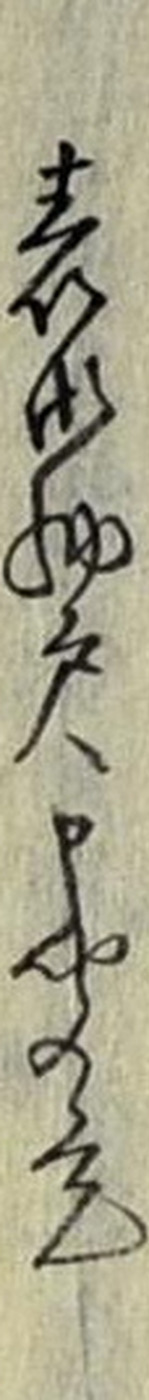表御納戸へ申聞覚
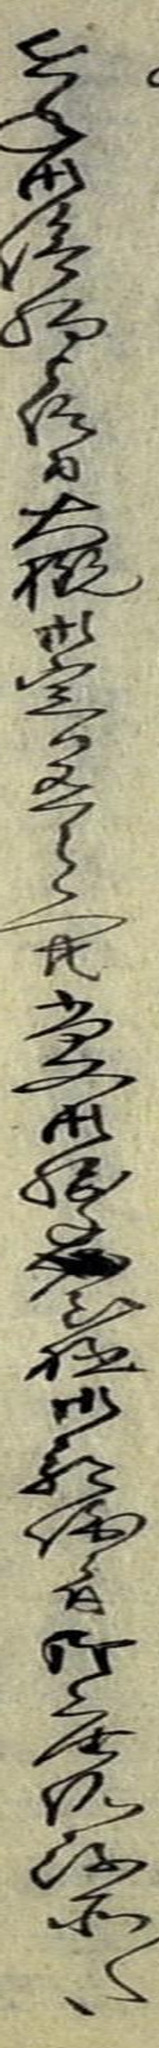近年御倹約被仰付大概御定ハ有之候へ共尚又御勝手至極御難儀ニ付御座所役所〳〵へ
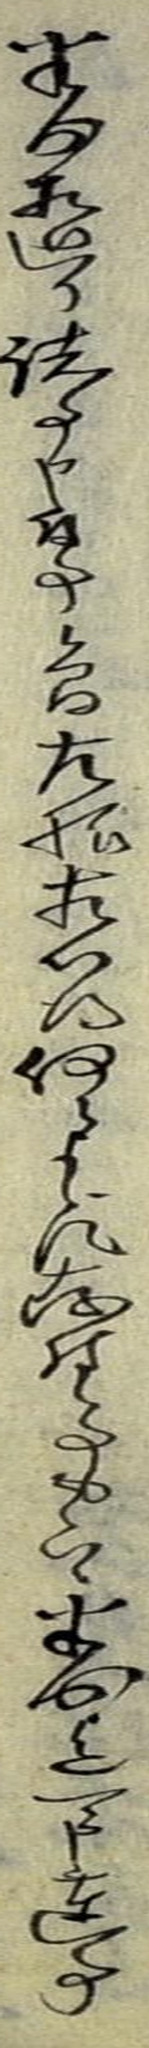半右衛門相廻り諸事申付事候間左様相心得何ニよらす存付候事も候ハヽ半右衛門迄可申達事
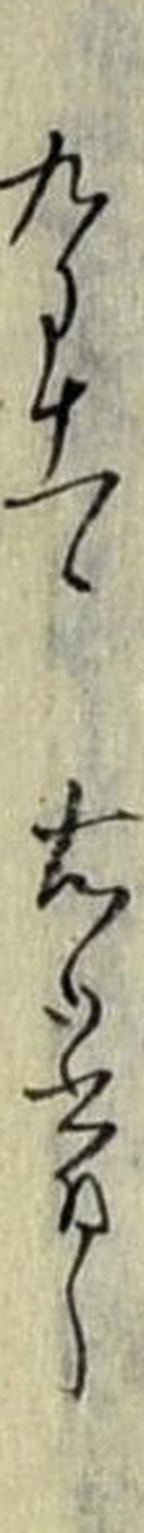九月十一日右御書付之
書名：命令之部 一
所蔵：福井県文書館 Fukui Prefectural Archives
